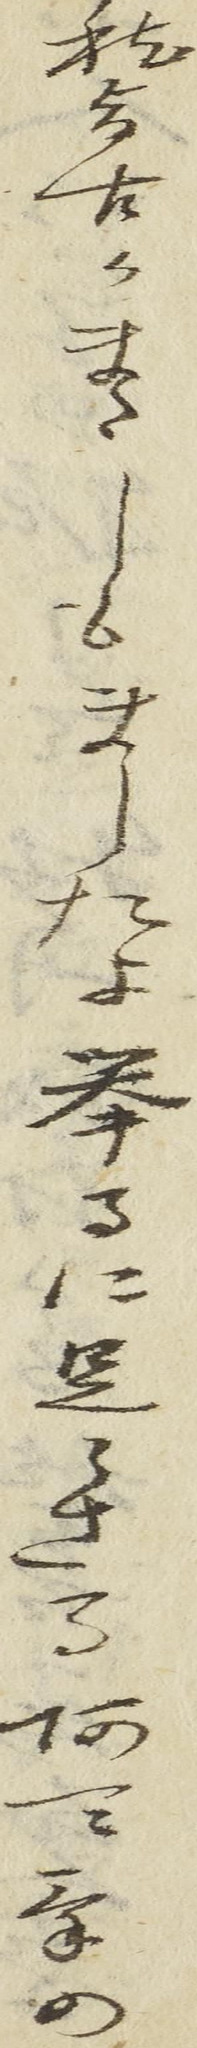稽古かまたしもましたよ挙るにたらさるあり気の

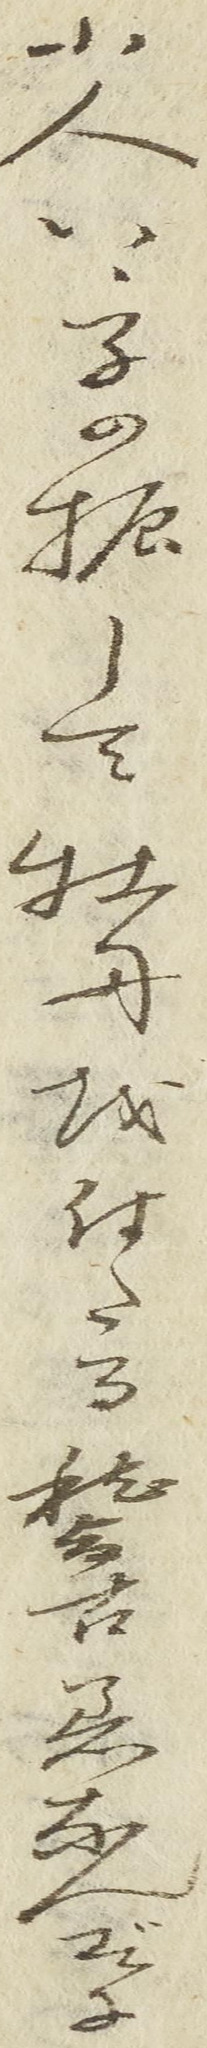小人いゝ子の振して牡丹を付けたる稽古着なんぞに
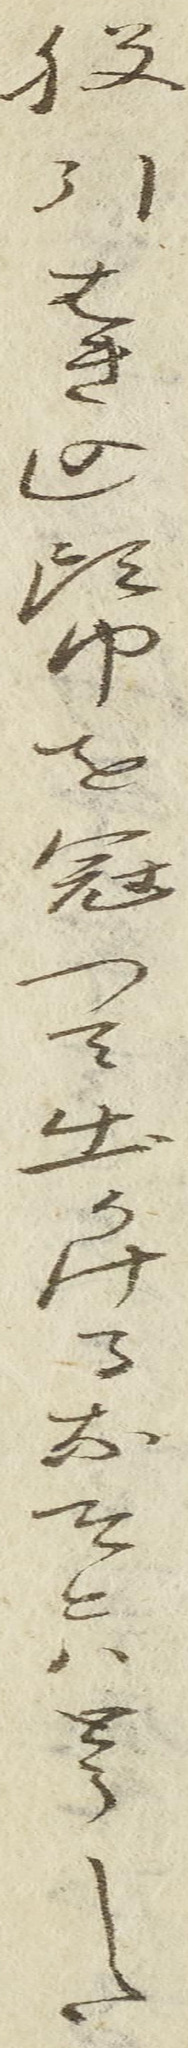股引はき込頭巾を冠つて出かけるなそとハとうした
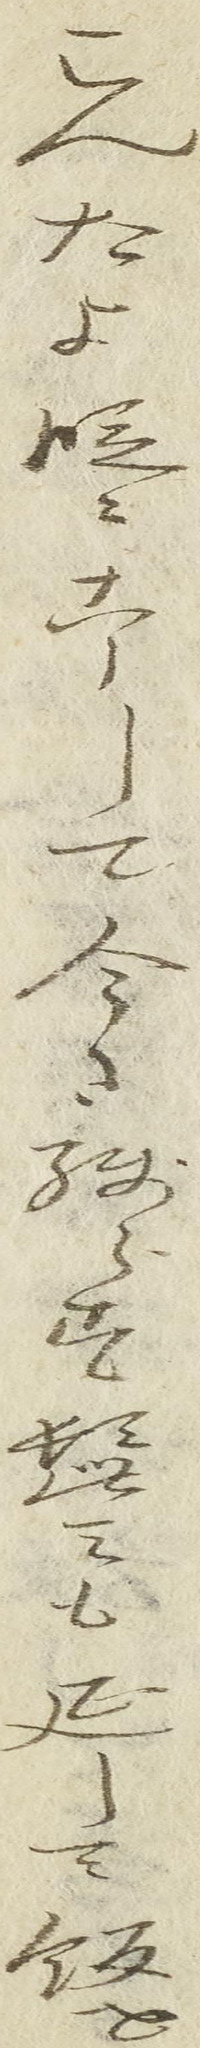こんたよ段々こうして今た残らす髪ミも延して飯を
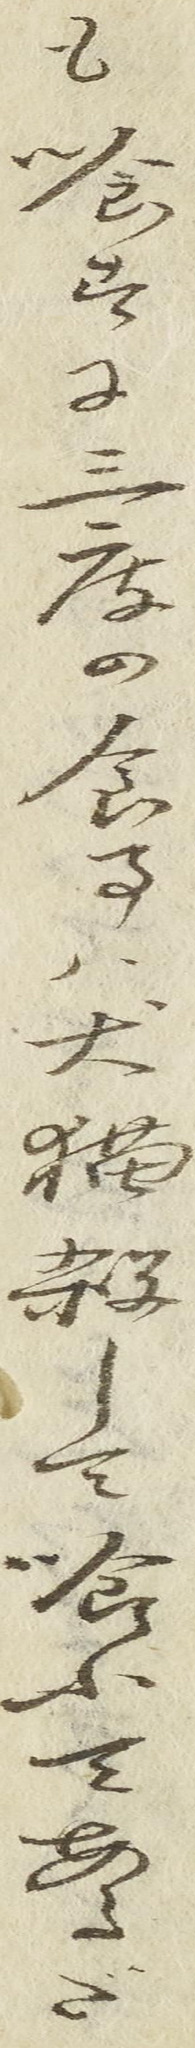も喰そに三度の食事ハ犬猫殺して喰ふてあるだ
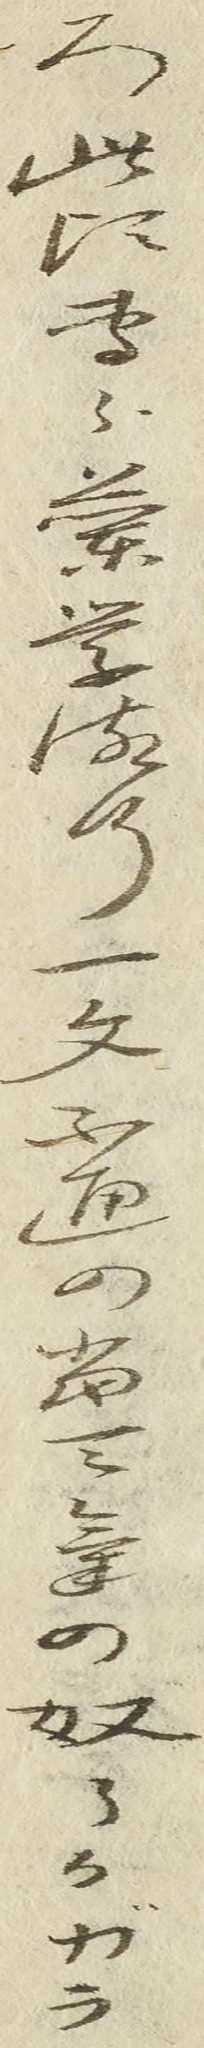ろ此比専ら蘭学はやり一文不通の当氣の奴らかガラ
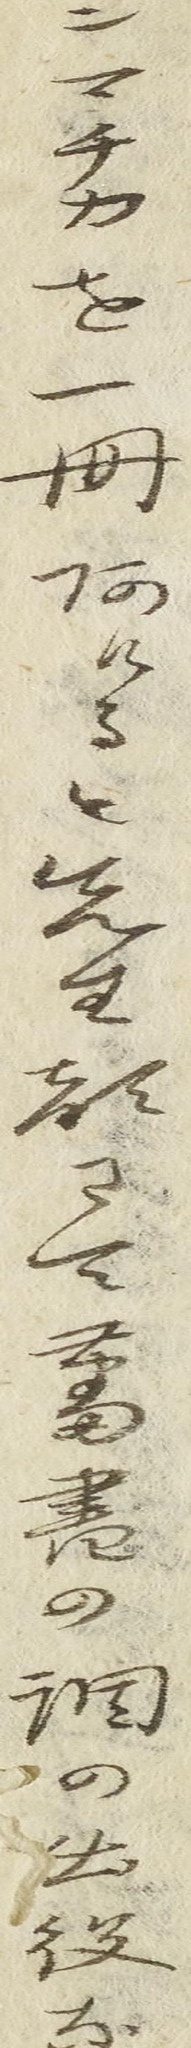ンマチカを一冊あけると先生願にて蕃畫の祠の出役な
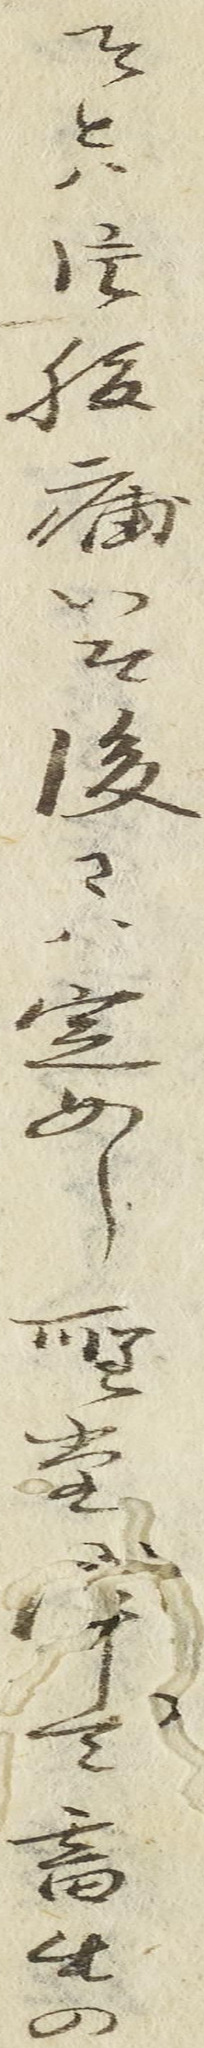そとハ片腹痛いそ後にハ定めし聖堂潰て畜生の
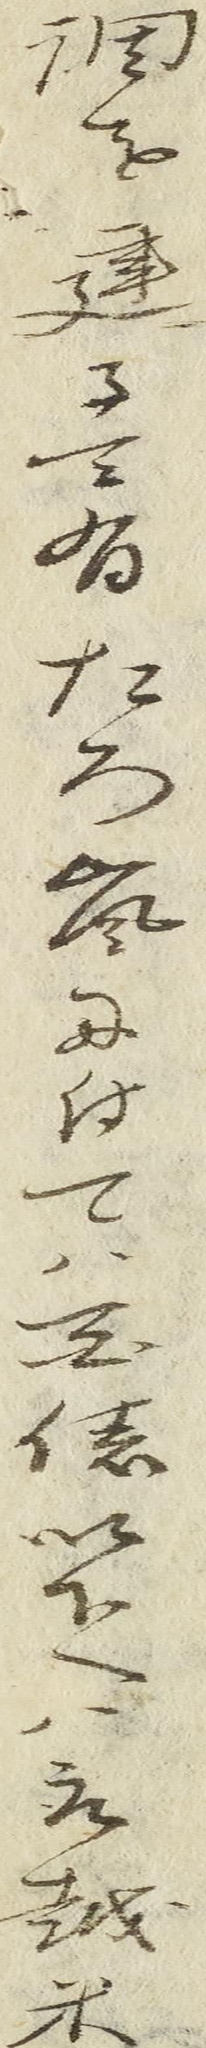祠を建るて有たろ嵐に付てハ百俵以下へハ取越米
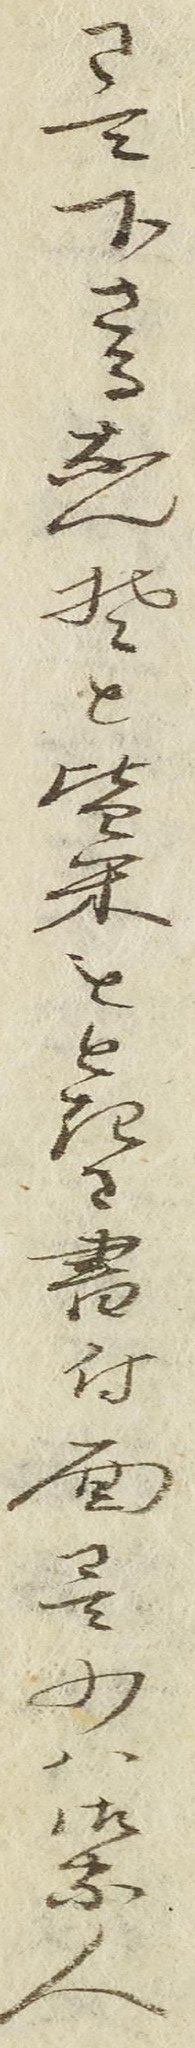にて下さるなんそと皆米もときに書付面にて少ハ御家人
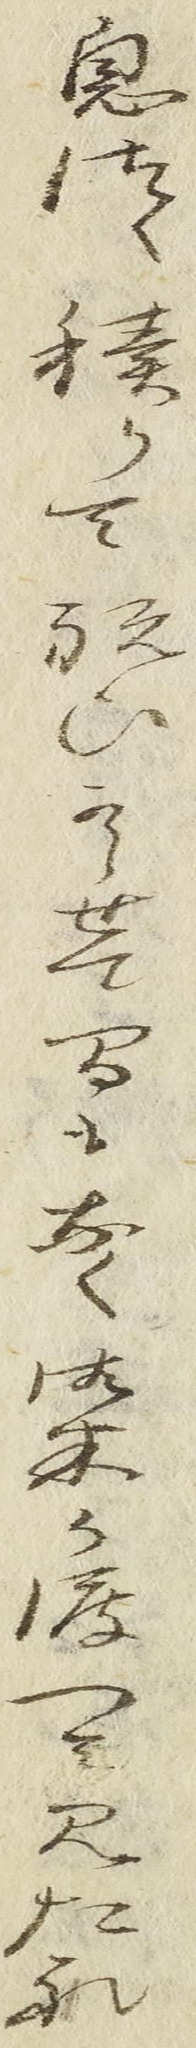息つく積りて祝ひからせて間もなく御米か渡つて見たれ
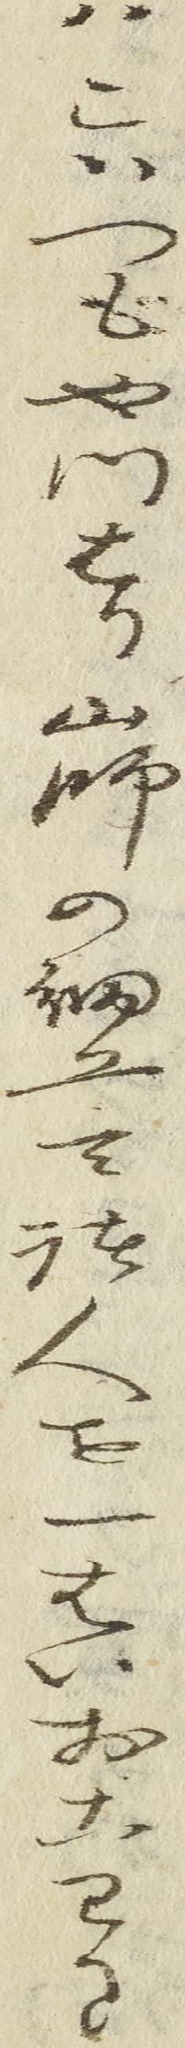ハこいつもやつはり山師の細工て諸人を一はいおこわに
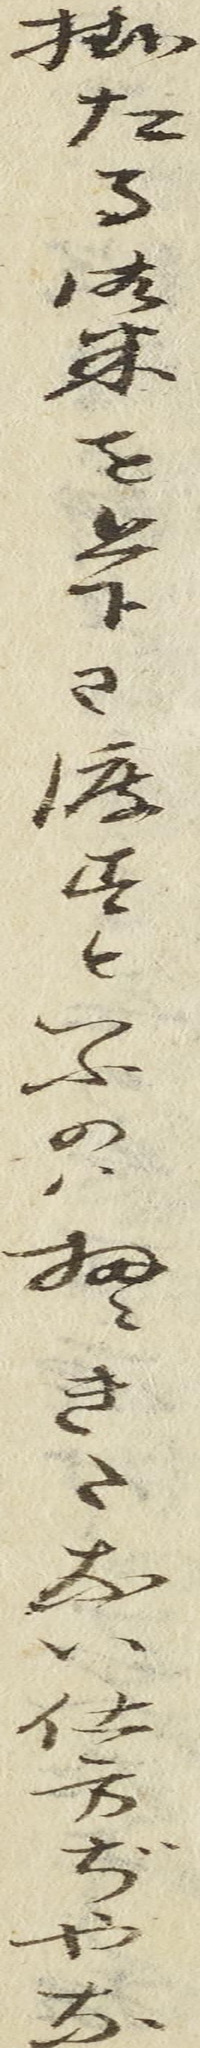拠たる御米を上下に渡すといふのハ扨々きたない仕方ぢやな
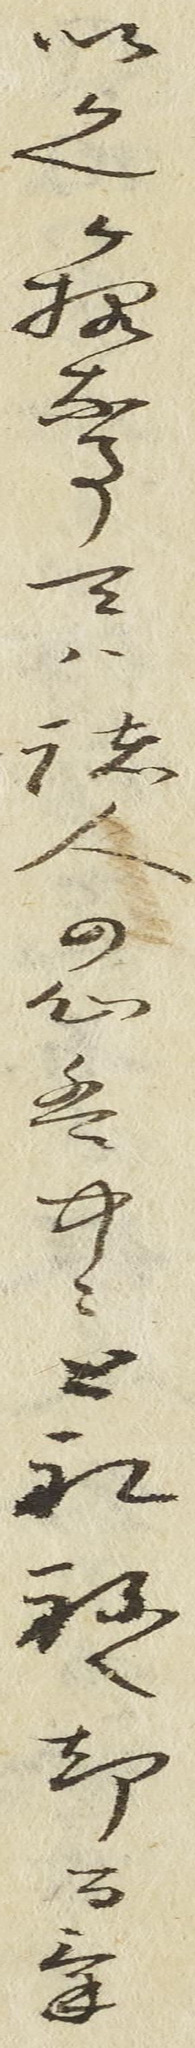いかへヶ様な事てハ諸人の心は中々とれねへ却て気
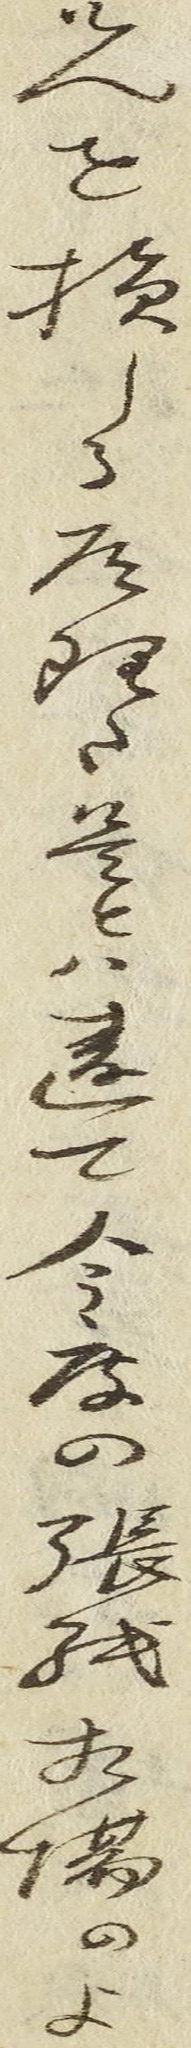けんを損しる道理た是とハ違て今度の張紙相場のよ
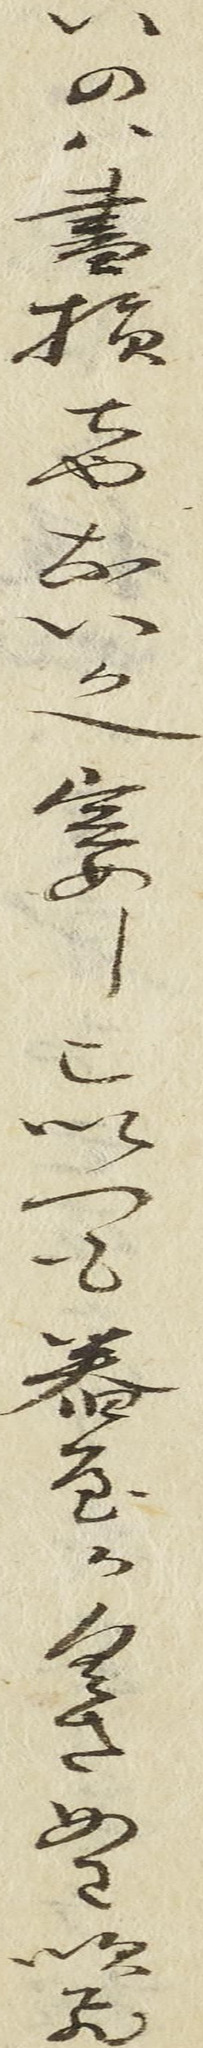いのハ書損ちやないかへ定めしこいつも舂屋かくさめに吹屋
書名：世説ヤンレフシ写、駿州田中城地震ニ付内外破損御届書、豫州大洲城地震ニ付内外破損御届書・封廻状
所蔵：東京大学地震研究所図書室 Earthquake Research Institute Library, The University of Tokyo, JAPAN
